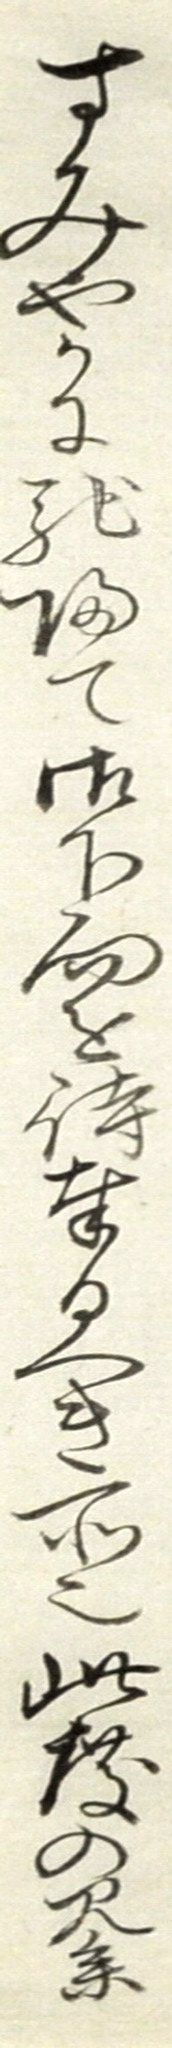すみやかに馳帰て御下向を待奉るへき所也此度の見参
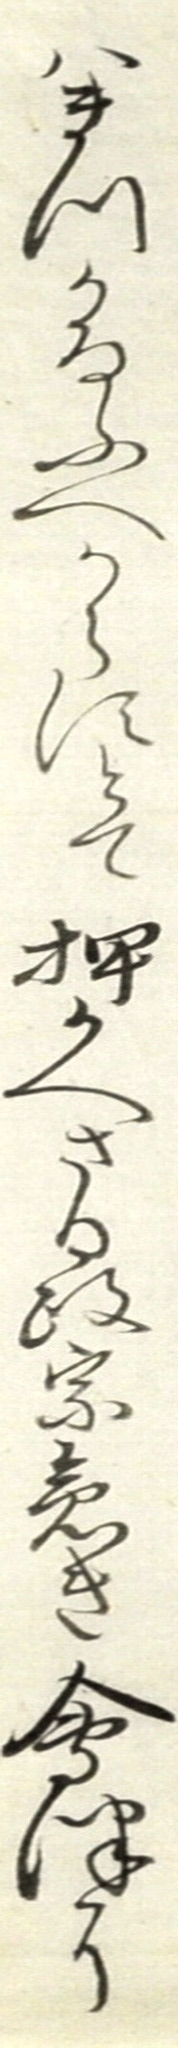はまつかなふへからすとて押かへさる政宗急き会津に
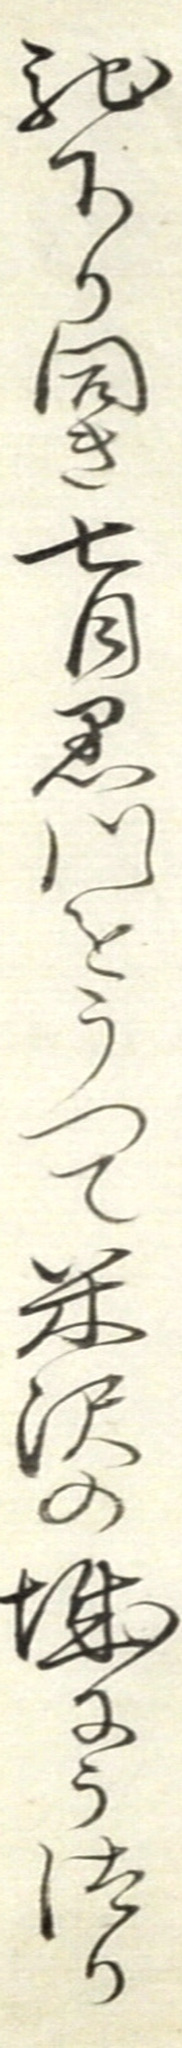馳下り同き七月黒川をうつて米沢の城にうつり
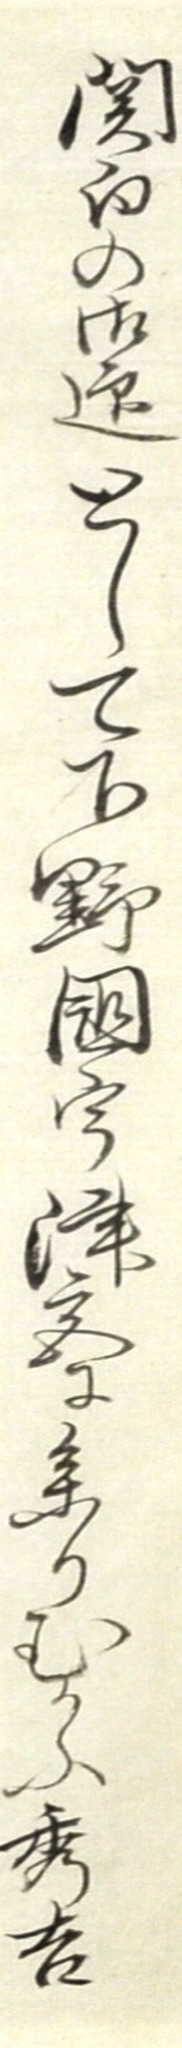関白の御迎として下野国宇津宮に参りむかふ秀吉
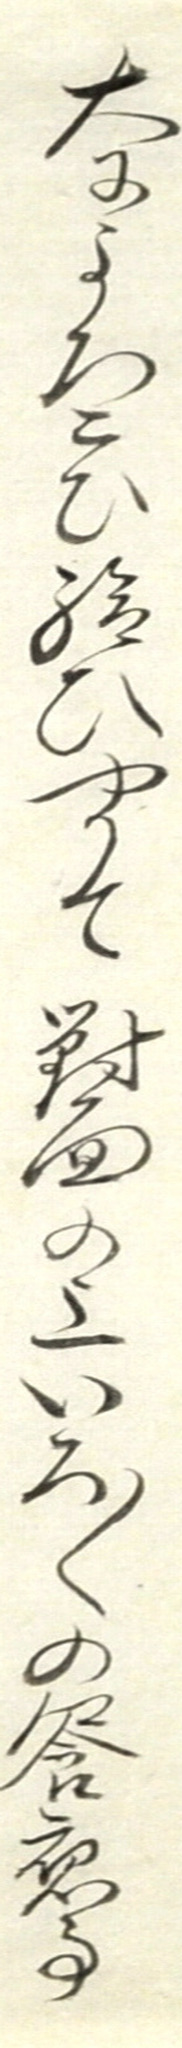大によろこひ給ひやかて対面の上いろ〳〵の饗応事
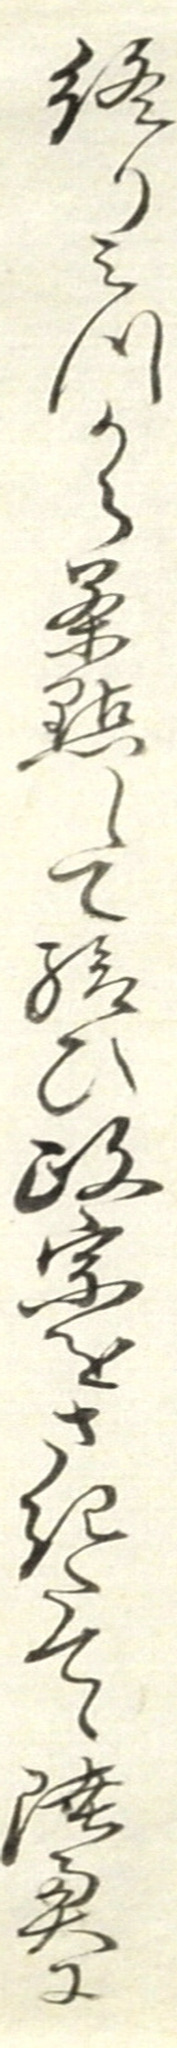終りみつから茶点して給ひ政宗をさきたてゝ陸奥に
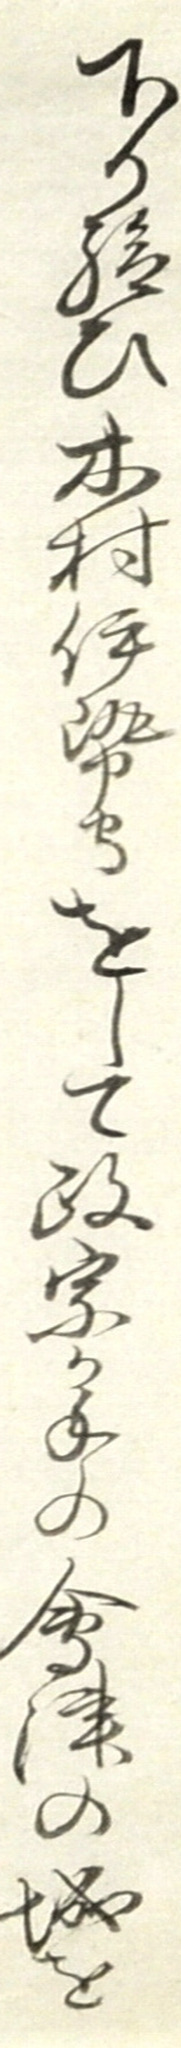下り給ひ木村伊勢守をして政宗か手の会津の城を
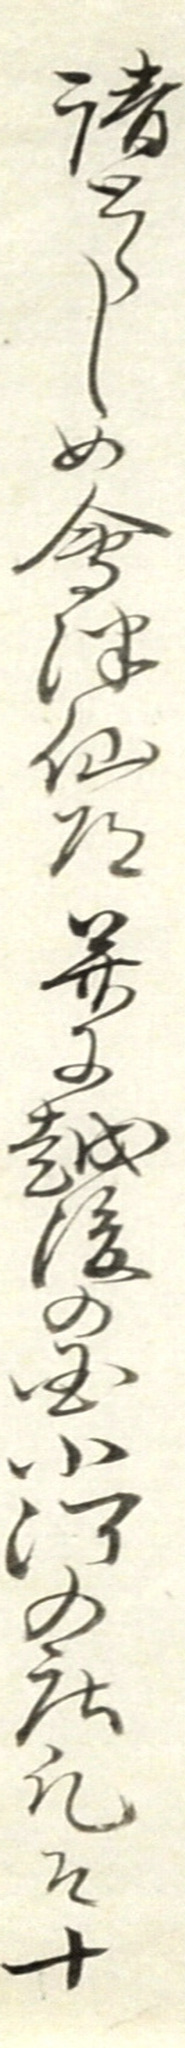請とらしめ会津仙道幷に越後の国小河の庄凡そ十
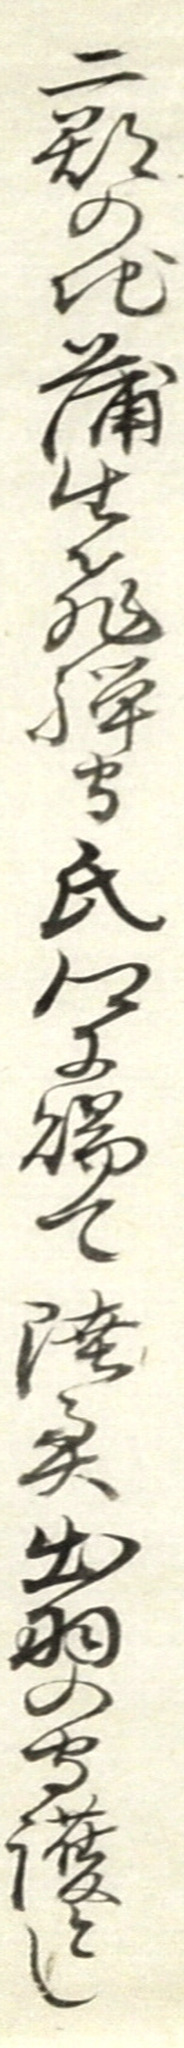二郡の地蒲生飛騨守氏郷に賜て陸奥出羽の守護とし
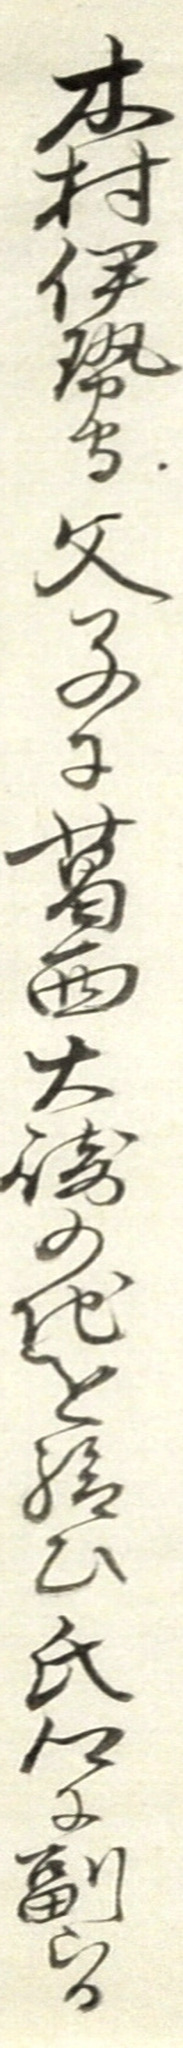木村伊勢守父子に葛西大崎の地を給ひ氏郷に副らる
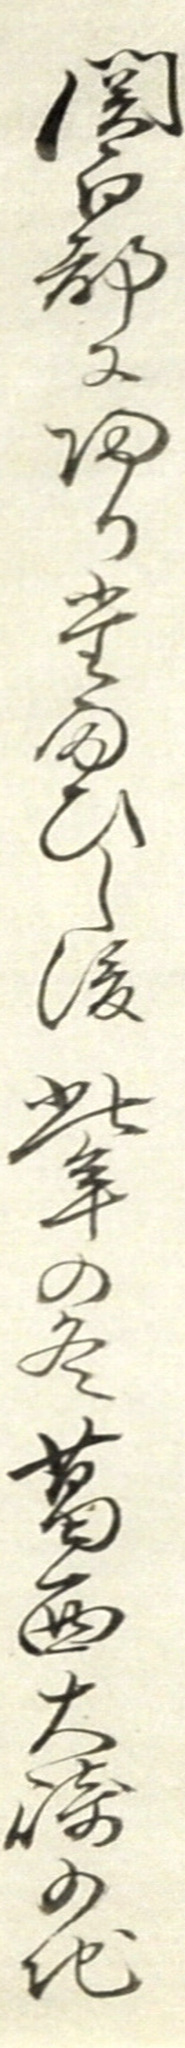関白都に帰りたまひし後此年の冬葛西大崎の地
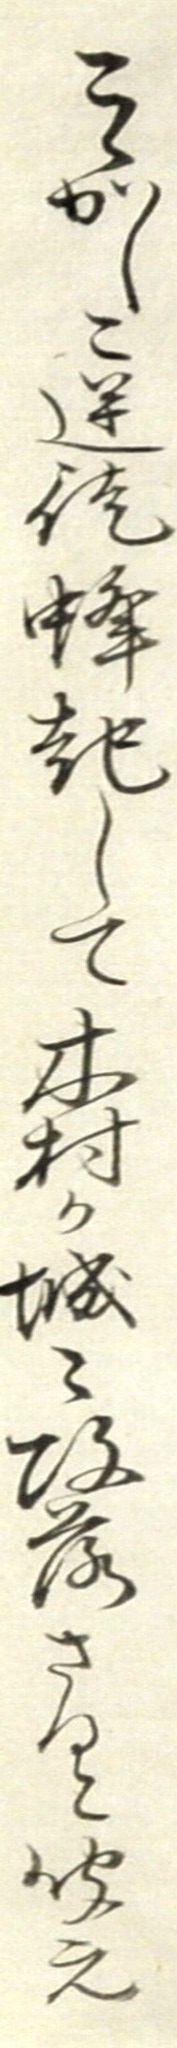こゝかしこ逆徒蜂起して木村か城々攻落さると聞え
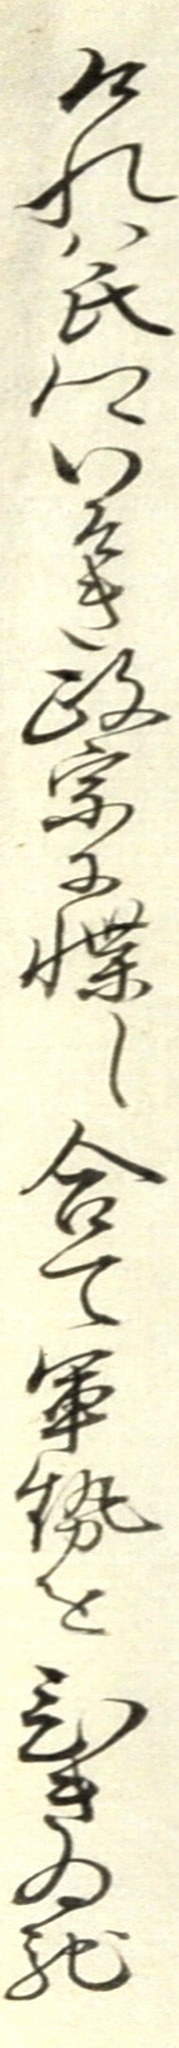けれは氏郷いそき政宗にし合て軍勢をひきゐ馳

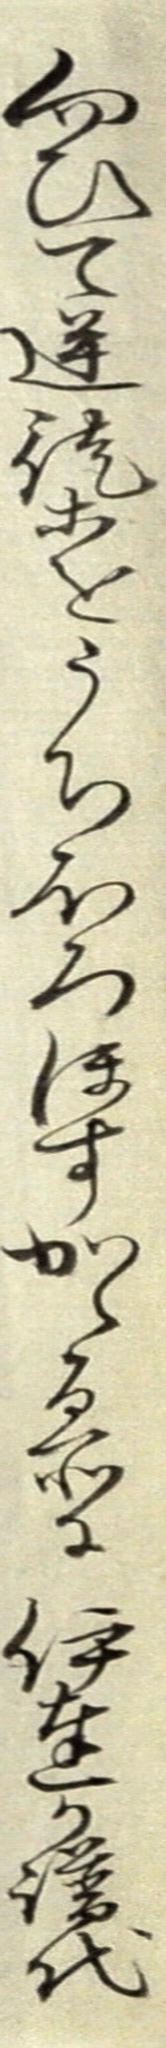向ひて逆徒等をうちほろほすかゝる所に伊達か藩代
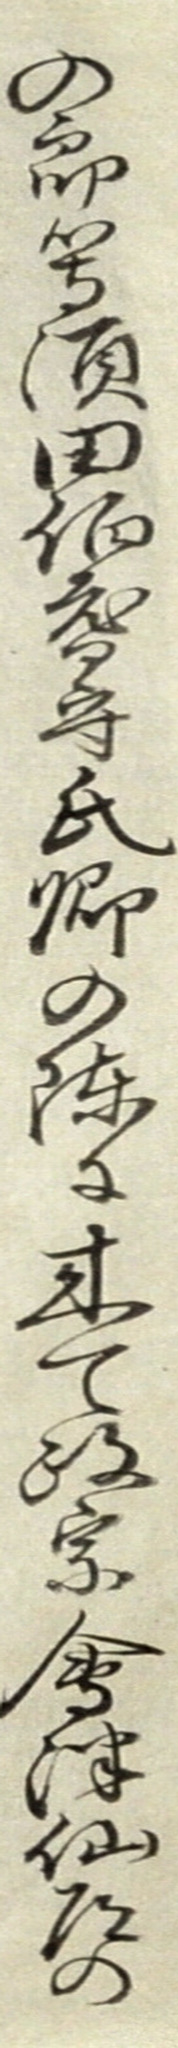の郎等須田伯耆守氏郷の陣に来て政宗会津仙道の
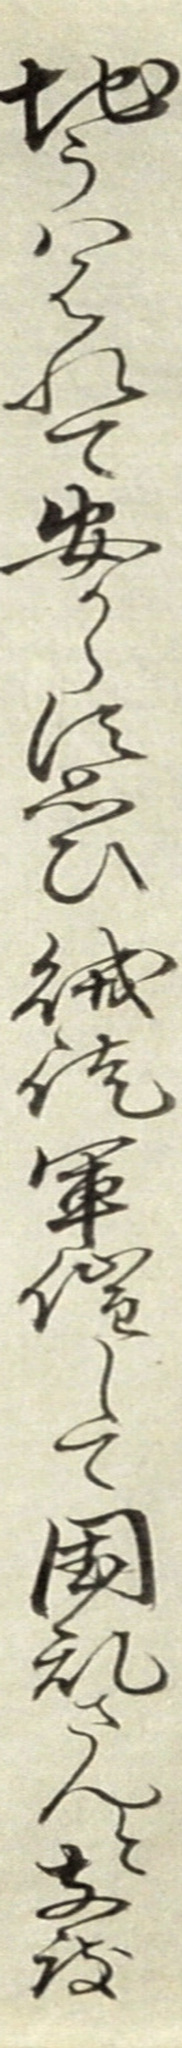地うははれて安からす思ひ賊徒軍催して国乱さんと支度
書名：藩翰譜（七・下）
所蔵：伊那市立高遠町図書館・合同会社AMANE
